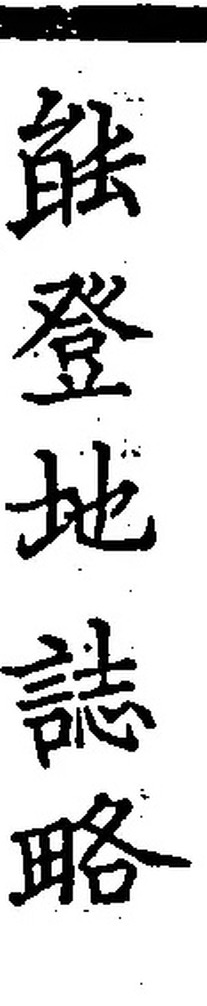能登地誌略
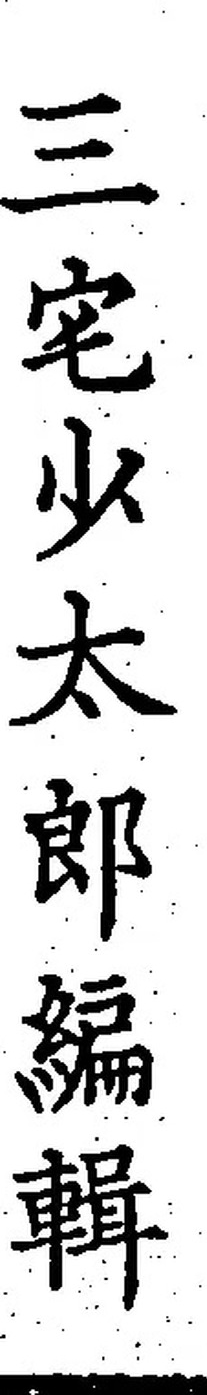三宅少太郎編輯
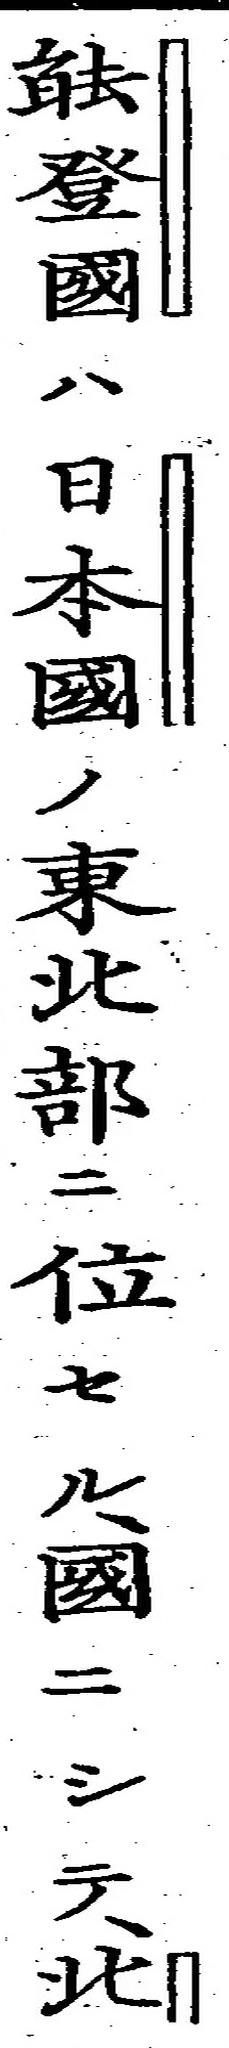能登国ハ日本国ノ東北部ニ位セル、国ニシテ、北
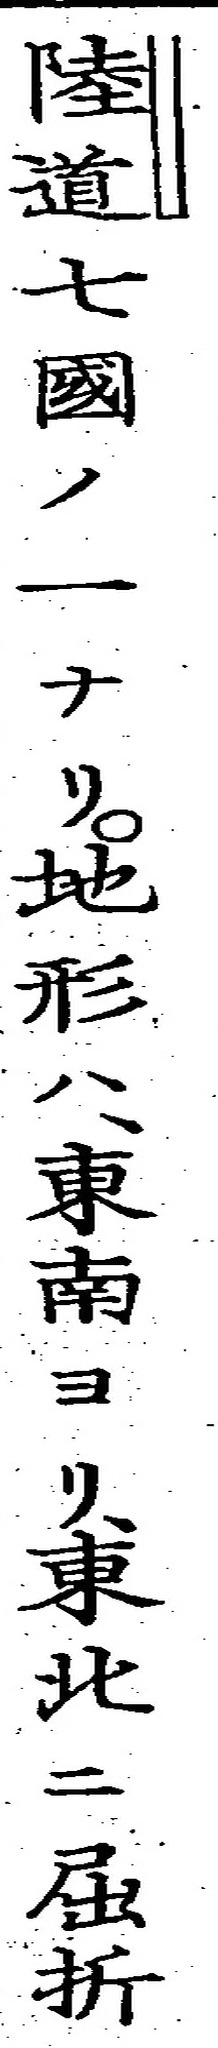陸道七国ノ一ナリ。地形ハ、東南ヨリ、東北ニ屈折
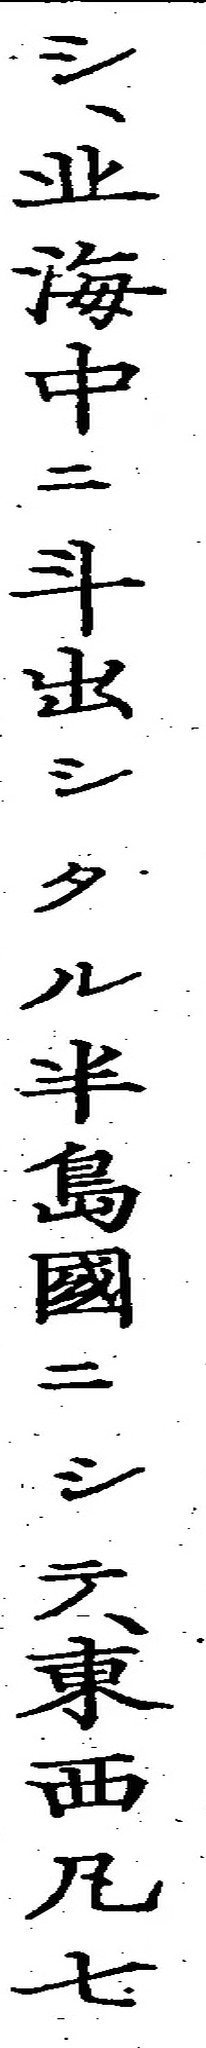シ、北海中ニ斗出シタル半島国ニシテ、東西凡七
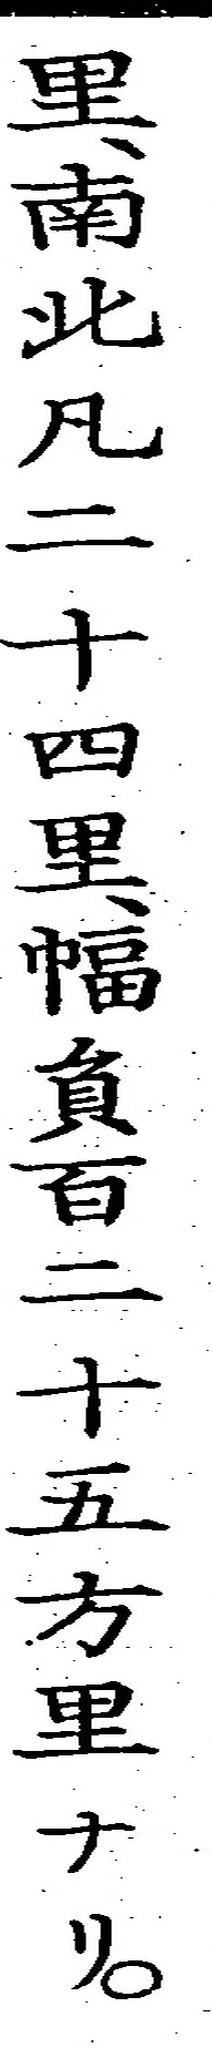里、南北凡二十四里、幅員百二十五方里ナリ。
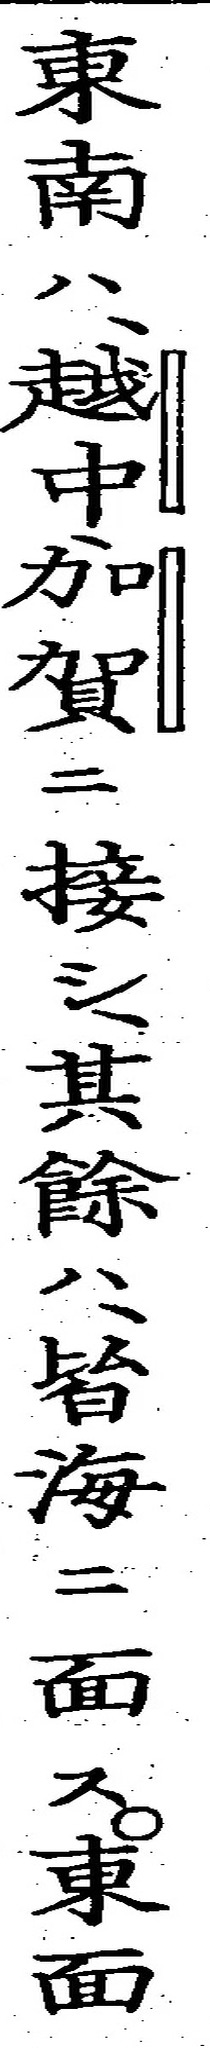東南ハ、越中・加賀ニ接シ、其余ハ、皆海ニ面ス。東面
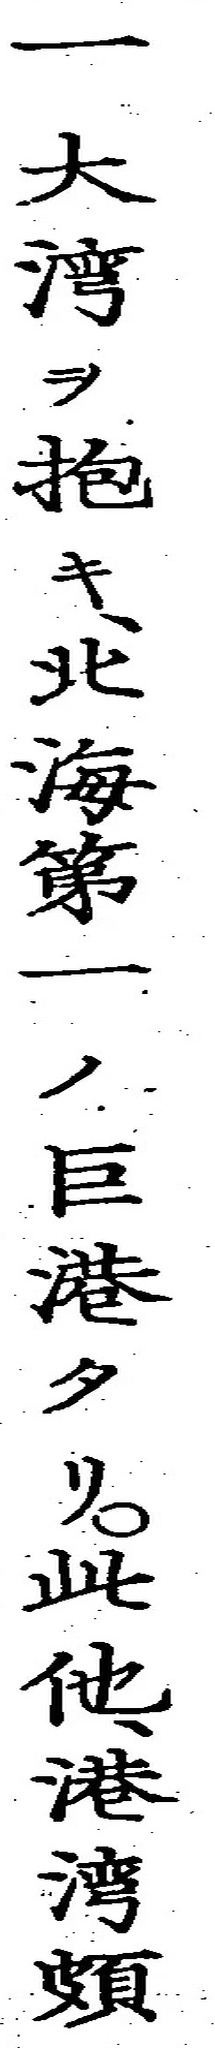一大湾ヲ抱キ、北海第一ノ巨港タリ。此他、港湾頗
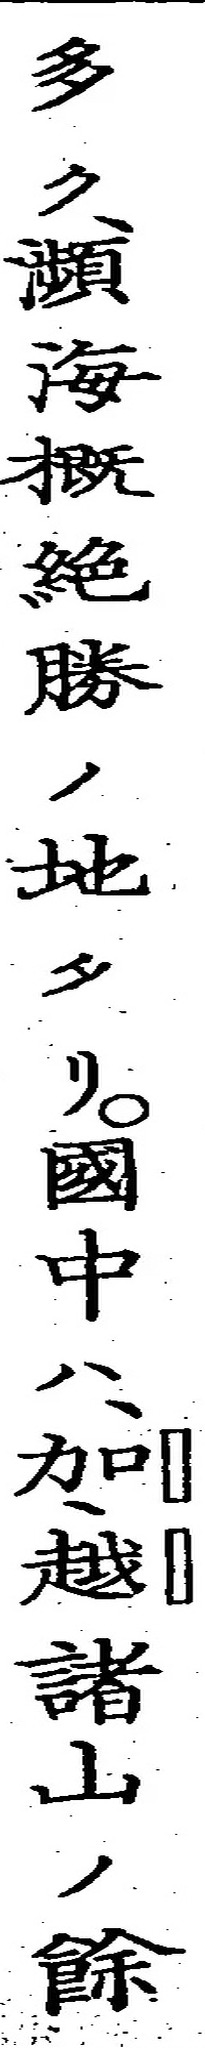多ク、瀕海概絶勝ノ地タリ。国中ハ、加・越諸山ノ余

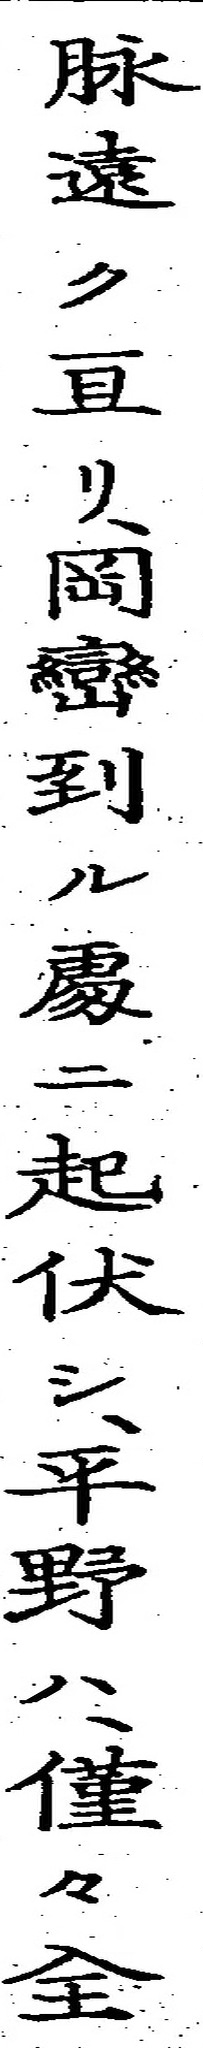脈遠ク亘リ、岡巒到ル処ニ起伏シ、平野ハ、僅々全
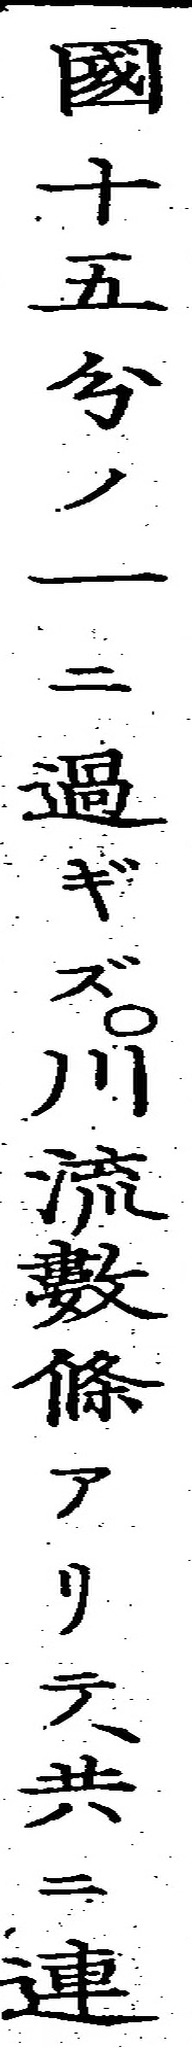国十五分ノ一ニ過ギズ。川流数条アリテ、共ニ連
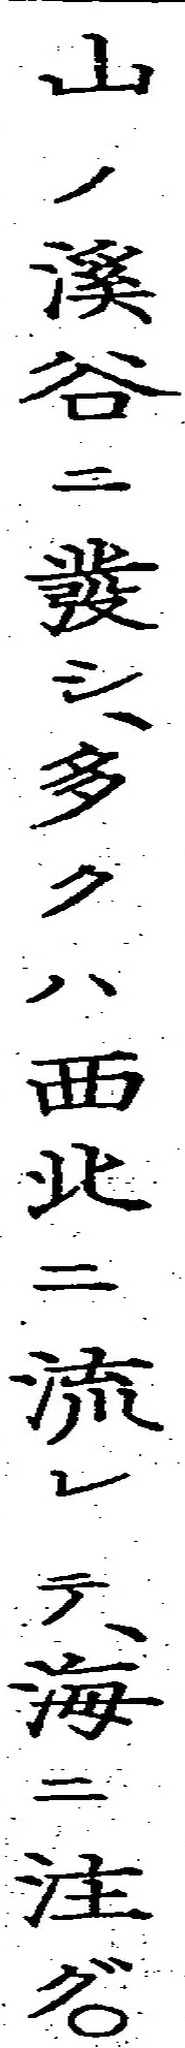山ノ渓谷ニ発シ、多クハ西北ニ流レテ、海ニ注グ。
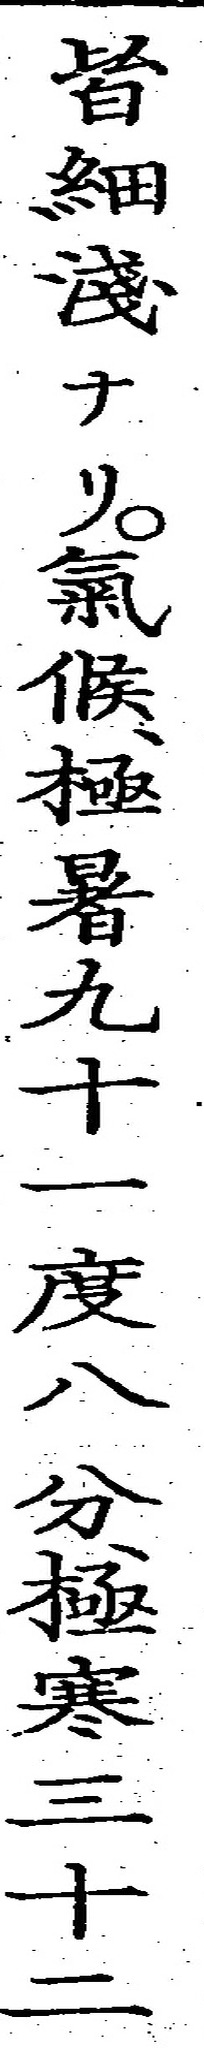皆細浅ナリ。気候、極暑九十一度八分、極寒三十二
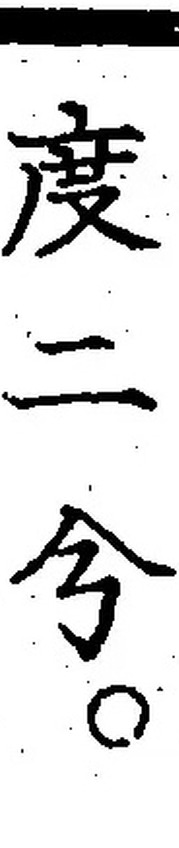度二分。
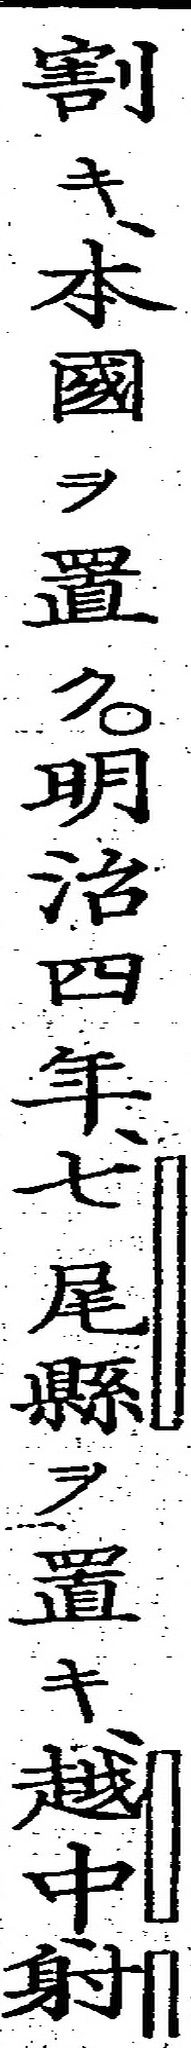割キ、本国ヲ置ク。明治四年、七尾県ヲ置キ、越中・射
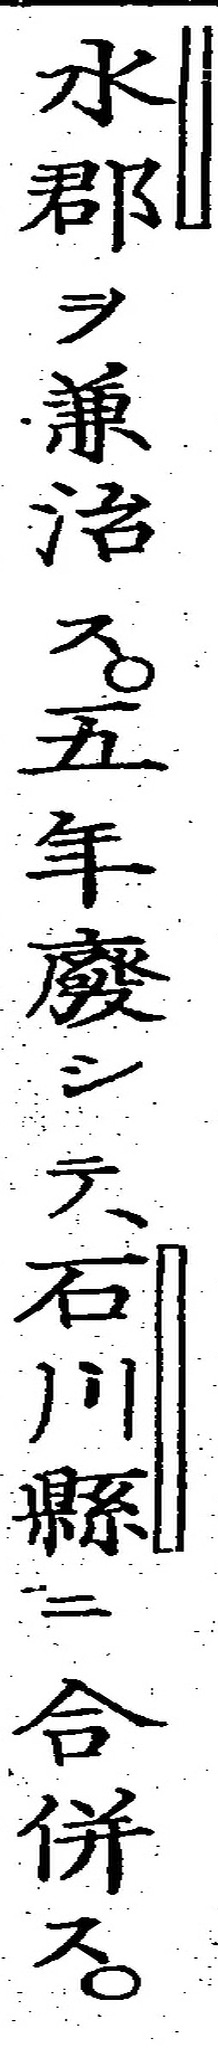水郡ヲ兼治ス。五年廃シテ、石川県ニ合併ス。
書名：能登地誌略
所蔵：国立国会図書館 National Diet Library, JAPAN
